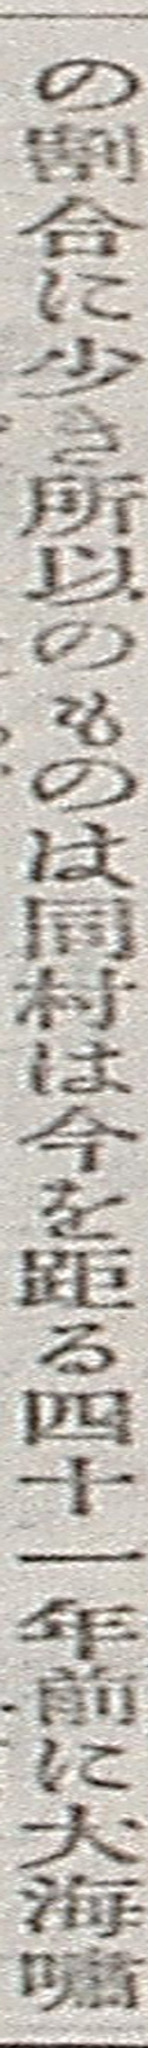の割合に少き所以のものは同村は今を距る四十一年前に大海嘯
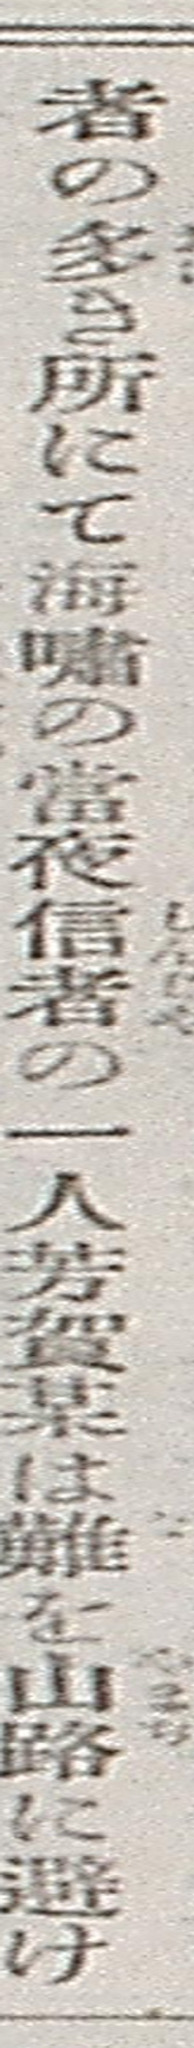者の多き所にて海嘯の当夜信者の一人芳賀某は難を山路に避け
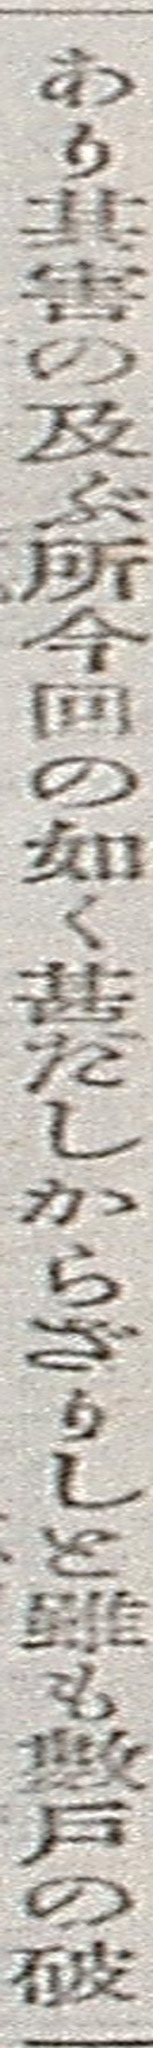あり其害の及ぶ所今回の如く甚だしからざりしと雖も数戸の破
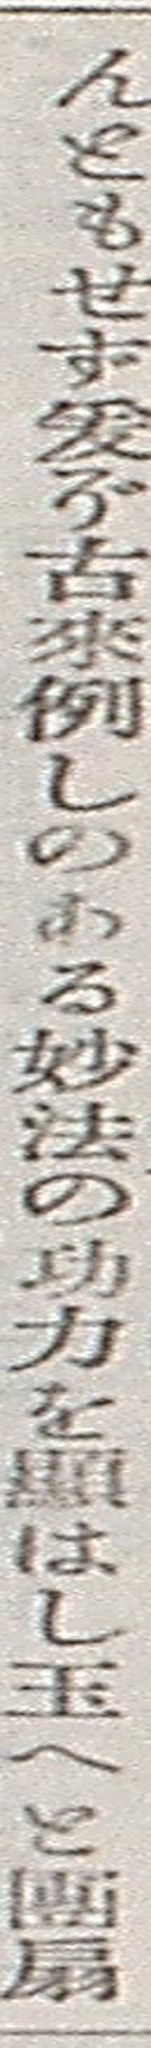んともせず爰ぞ古来例しのある妙法の功力を顕はし玉へと団扇
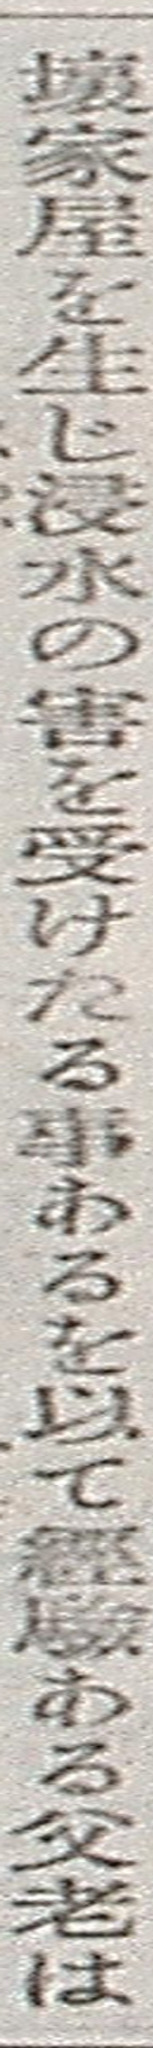壊家屋を生じ浸水の害を受けたる事あるを以て経験ある父老は
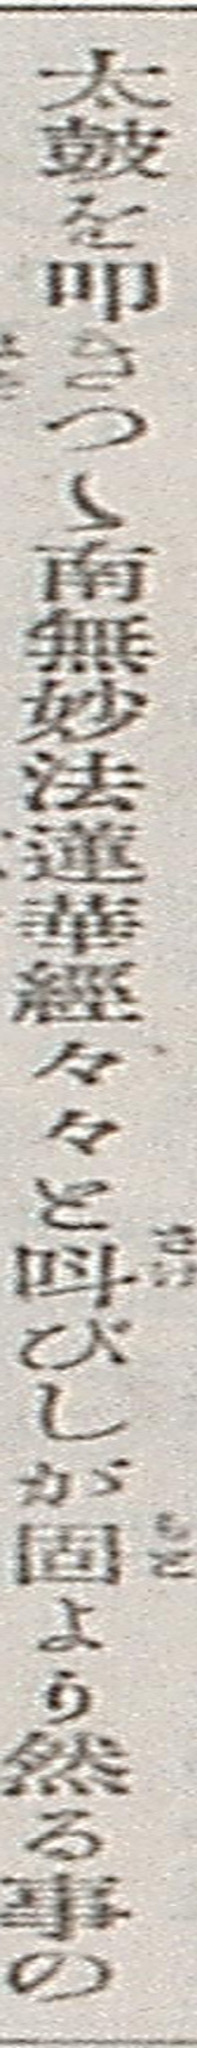太皷を叩きつゝ南無妙法蓮華経々々と叫びしが固より然る事の
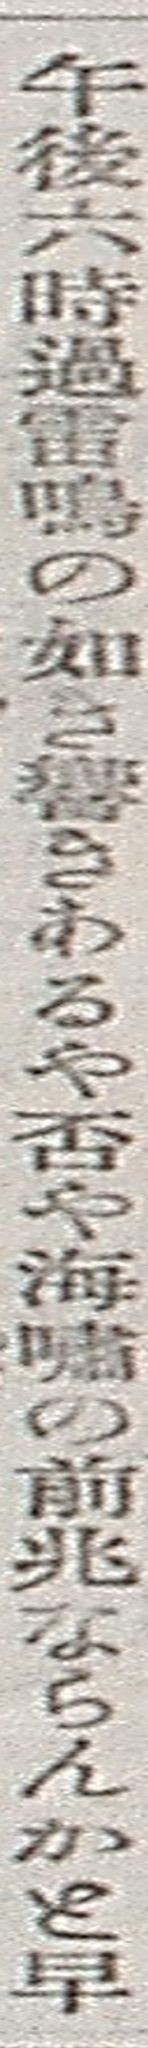午後六時過雷鳴の如き響きあるや否や海嘯の前兆ならんかと早
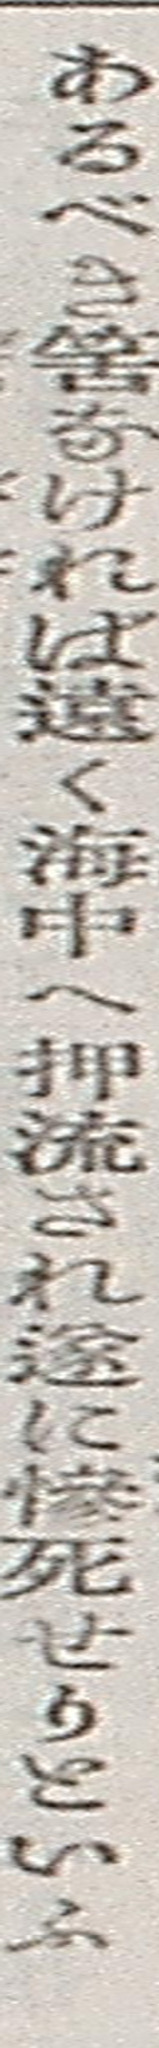あるべき筈なければ遠く海中へ押流され遂に惨死せりといふ
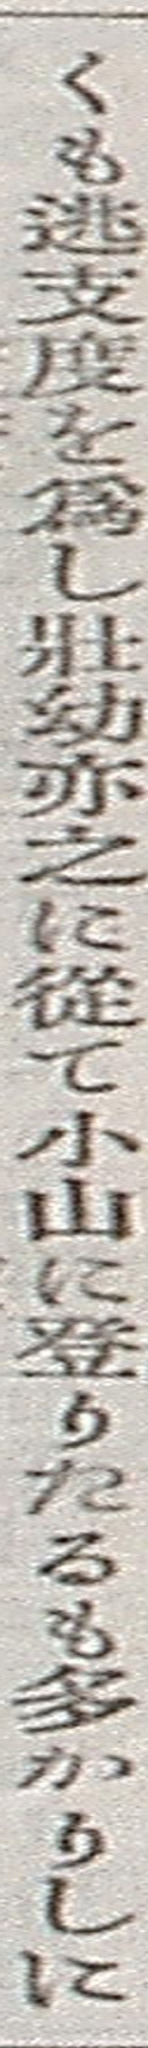くも逃支度を為し壮幼亦之に従て小山に登りたるもの多かりしに
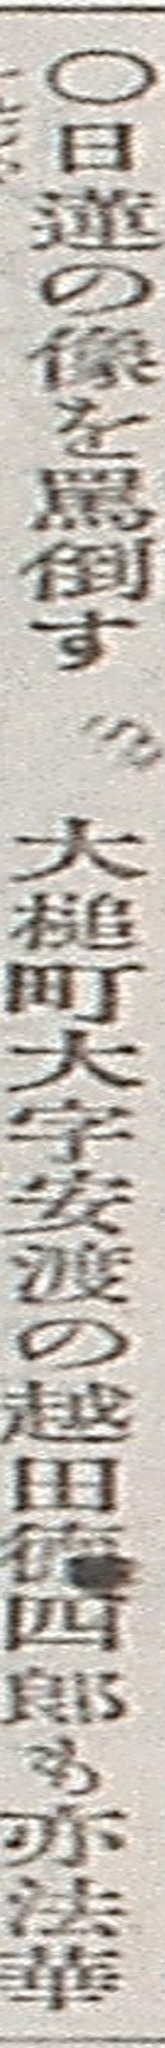○日蓮の像を罵倒す大槌町大字安渡の越田徳四郎も亦法華
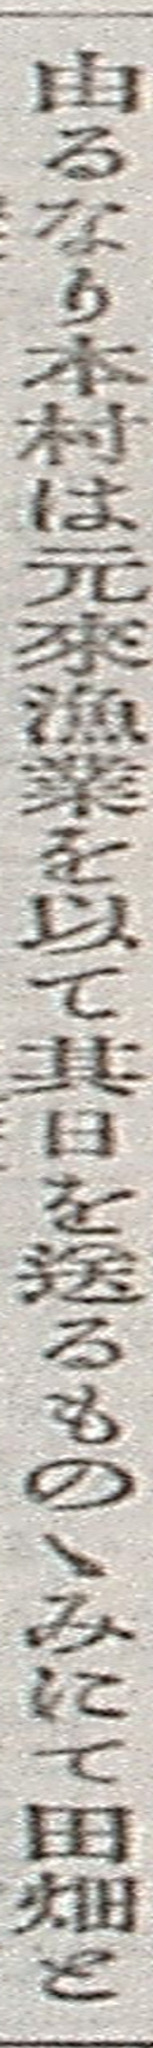由るなり本村は元来漁業を以て其日を送るものゝみにて田畑と
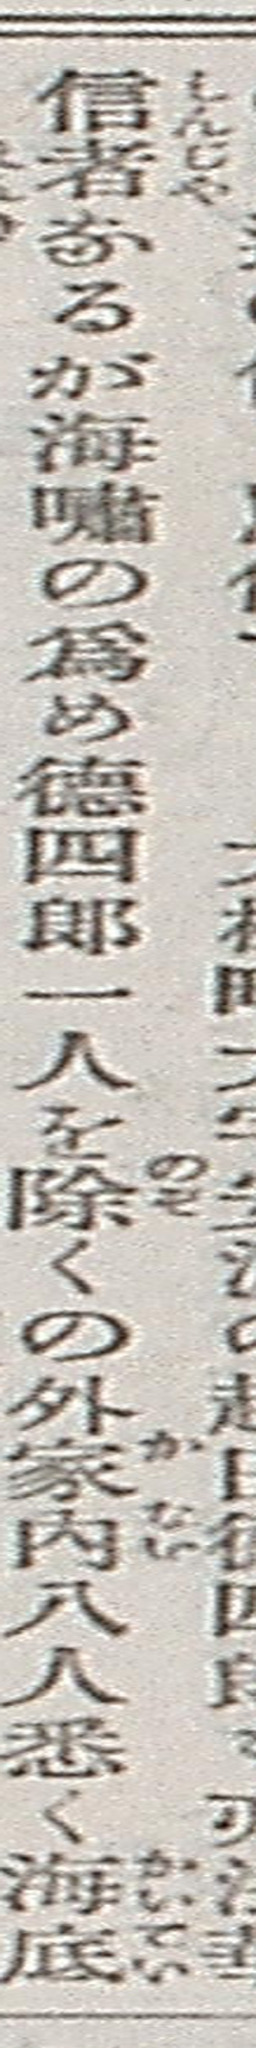信者なるが海嘯の為め徳四郎一人を除くの外家内八人悉く海底
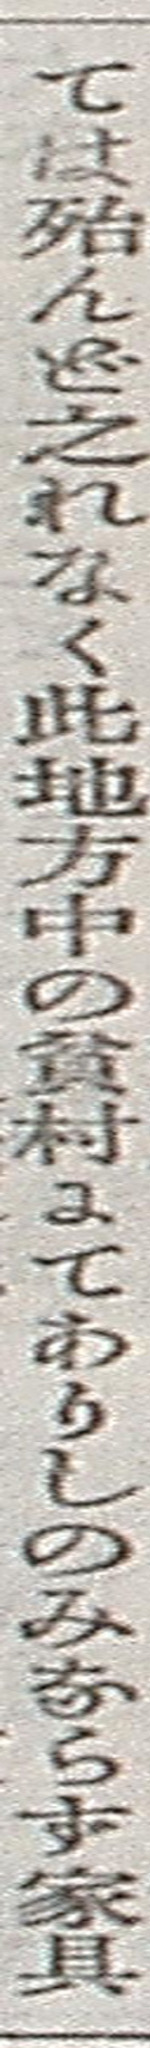ては殆んど之れなく此地方中の貧村にてありしものみならず家具
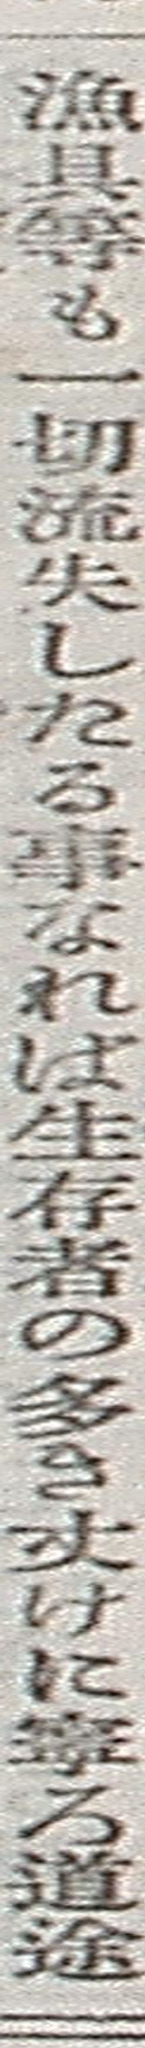漁具等も一切流失したる事なれば生存者の多き丈けに寧ろ道途
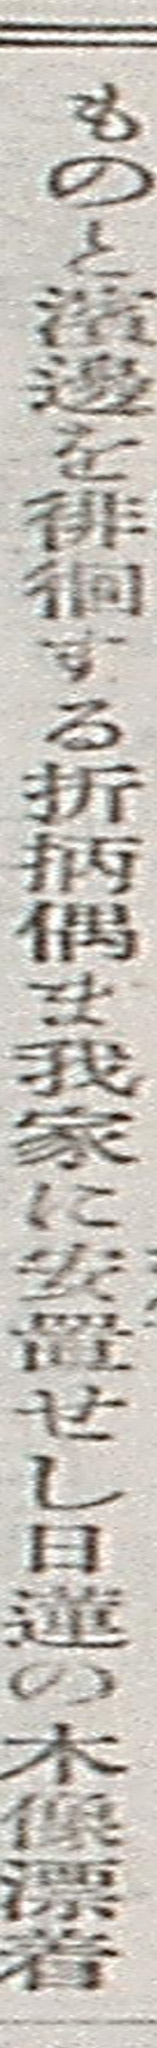ものと浜辺を徘徊する折柄偶ま我家に安置せし日蓮の木像漂着
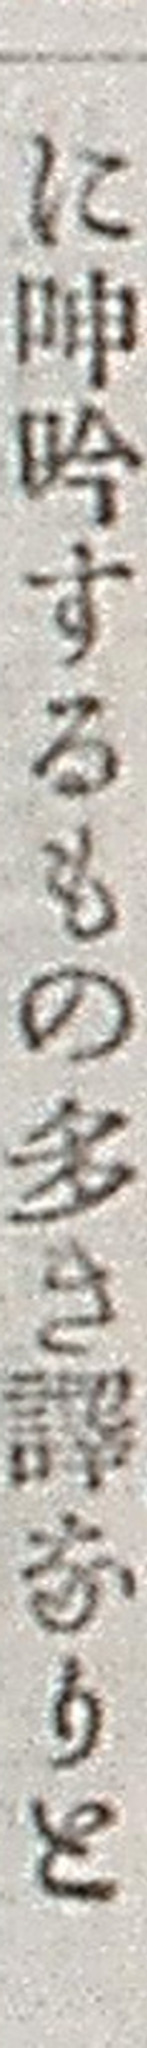に呻吟するもの多き訳なりと
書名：風俗畫報臨時増刊第百二十號　大海嘯被害録（下）
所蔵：東京大学地震研究所図書室 Earthquake Research Institute Library, The University of Tokyo, JAPAN
